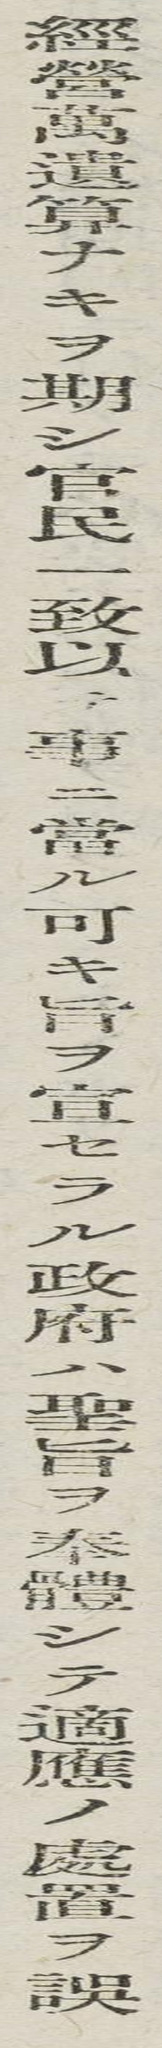経営万遺算ナキヲ期シ官民一致以テ事ニ当ル可キ旨ヲ宣セラル政府ハ聖旨ヲ奉体シテ適応ノ処置ヲ誤
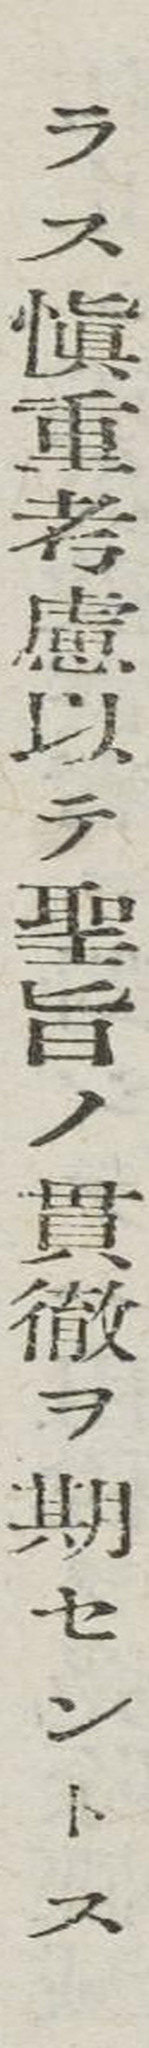ラス慎重考慮以テ聖旨ノ貫徹ヲ期セントス
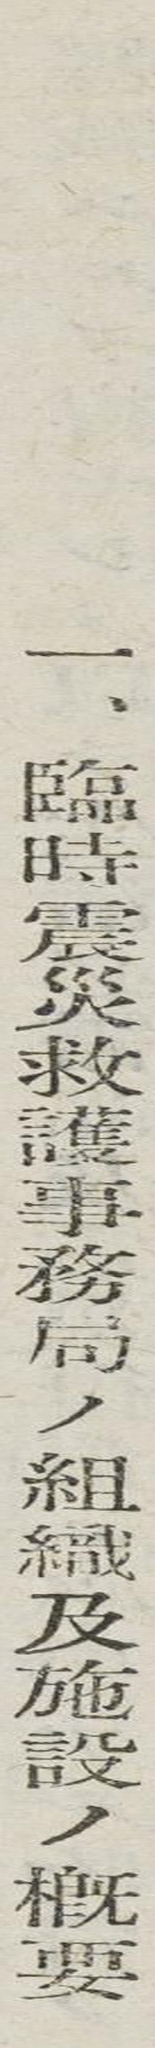一、臨時震災救護事務局ノ組織及施設ノ概要
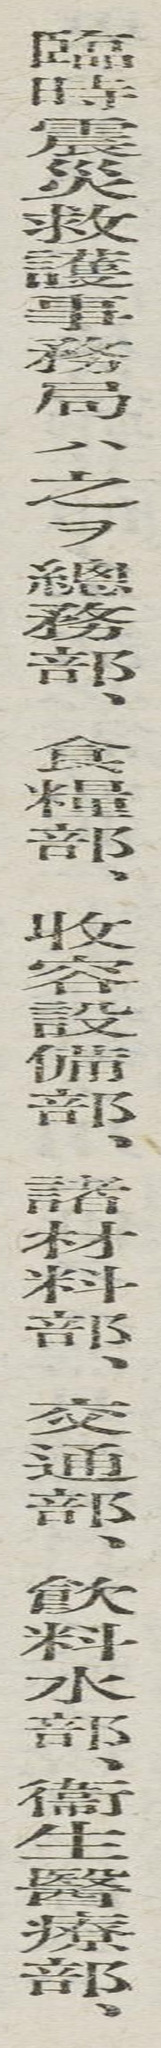臨時震災救護事務局ハ之ヲ総務部、食糧部、収容設備部、交通部、飲料水部、衛生医療部、
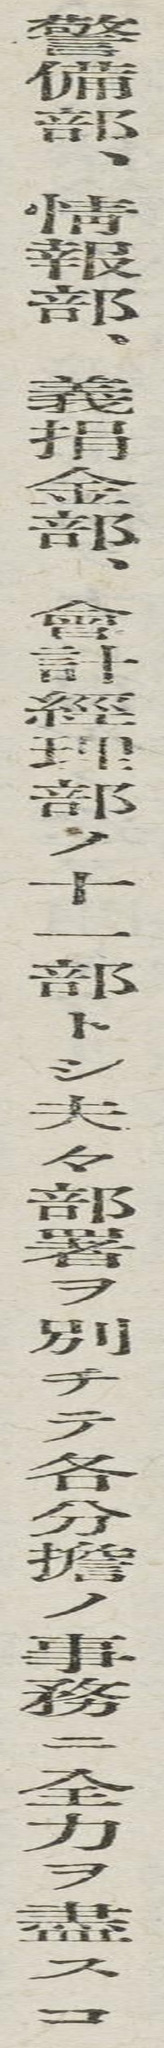警備部、情報部、義捐金部、会計経理部ノ十一部トシ夫々部署ヲ別チテ各分担ノ事務ニ全力ヲ尽スコ
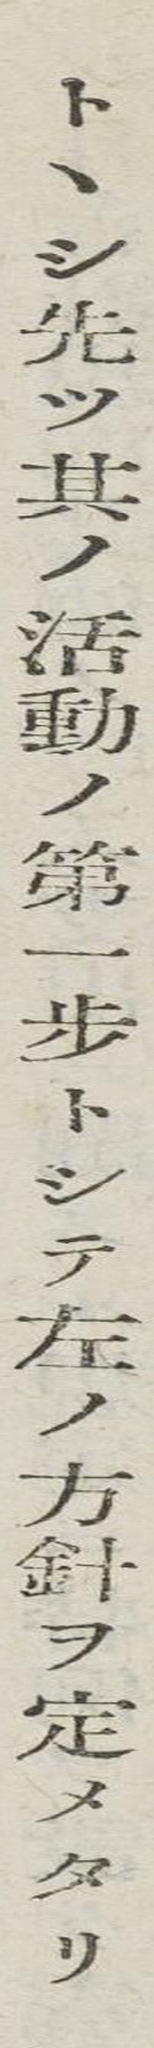トヽシ先ツ其ノ活動ノ第一歩トシテ左ノ方針ヲ定メタリ
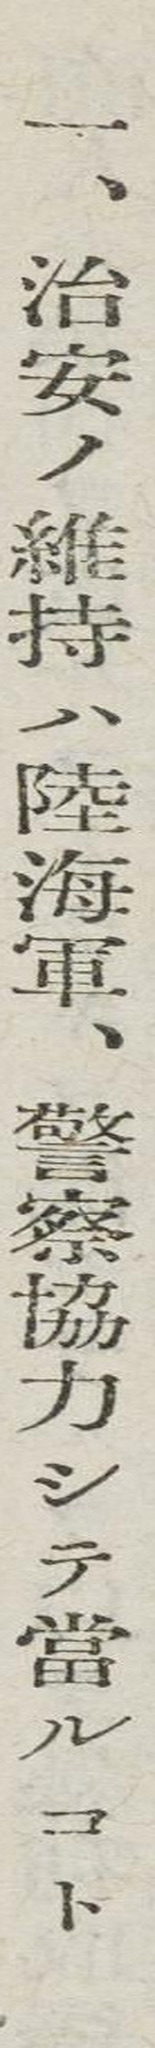一、治安ノ維持ハ陸海軍、警察協力シテ当ルコト
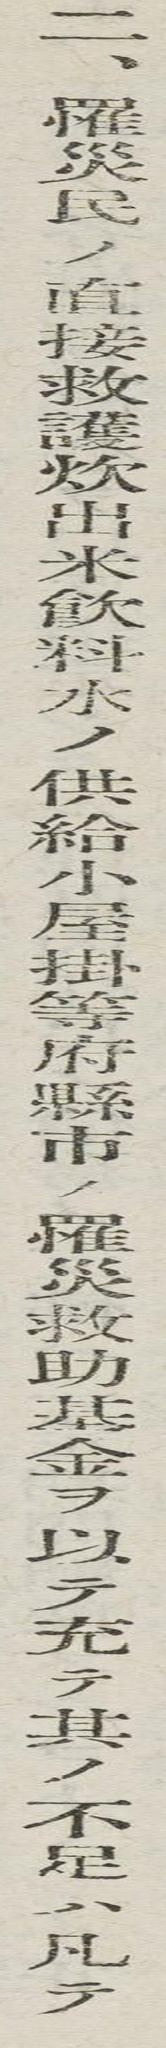二、罹災民ノ直接救護炊出米飲料水ノ供給小屋掛等府県市ノ罹災救助基金ヲ以テ充テ其ノ不足ハ凡テ
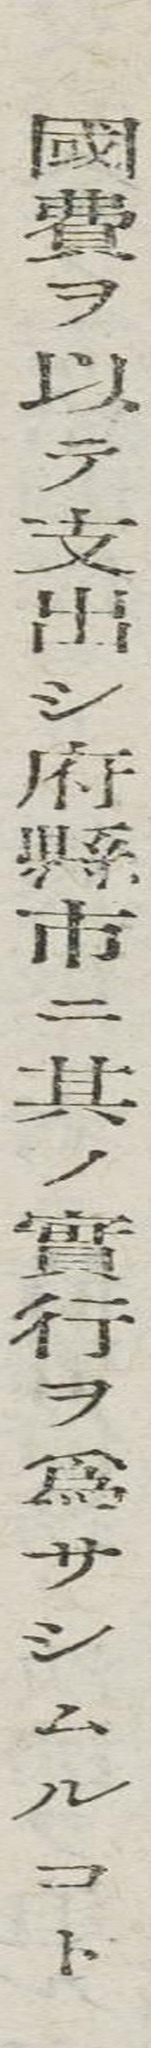国費ヲ以テ支出シ府県市ニ其ノ実行ヲ為サシムルコト
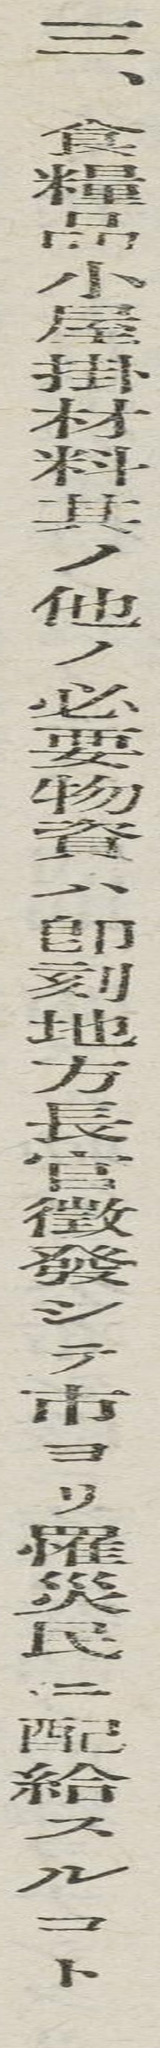三、食糧品小屋掛材料其ノ他ノ必要物資ハ即刻地方長官徴発シテ市ヨリ罹災民ニ配給スルコト
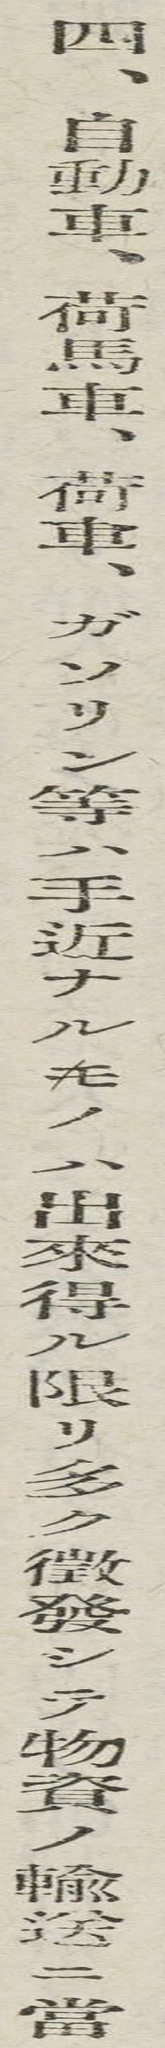四、自動車、荷馬車、荷車、ガソリン等ハ手近ナルモノハ出来得ル限リ多ク徴発シテ物資ノ輸送ニ当
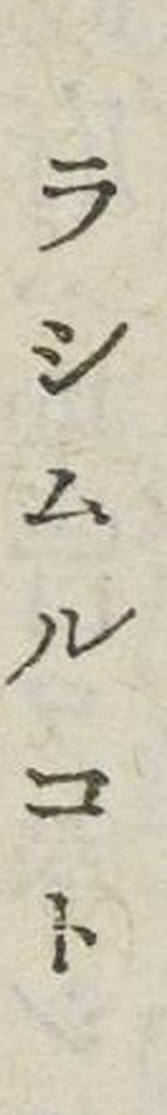ラシムルコト
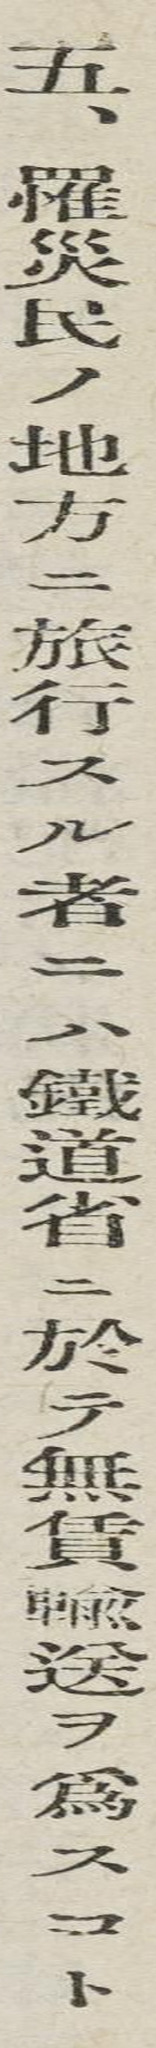五、罹災民ノ地方ニ旅行スル者ニハ鉄道省ニ於テ無賃輸送ヲ為スコト
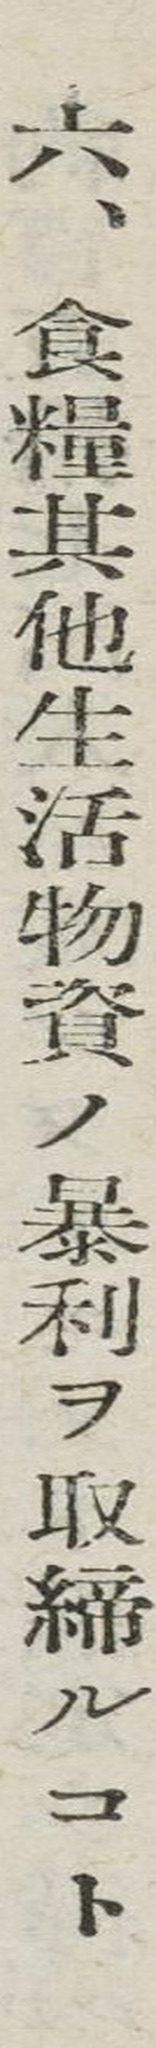六、食糧其他生活物資ノ暴利ヲ取締ルコト
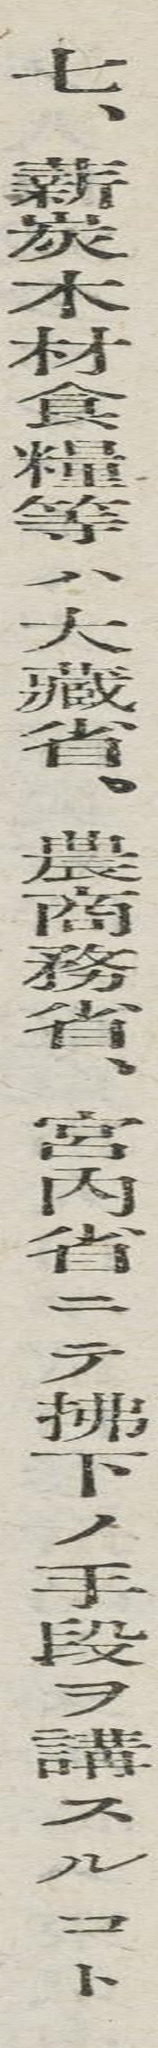七、薪炭木材食糧等ハ大蔵省、農商務省、宮内省ニテ払下ノ手段ヲ講スルコト
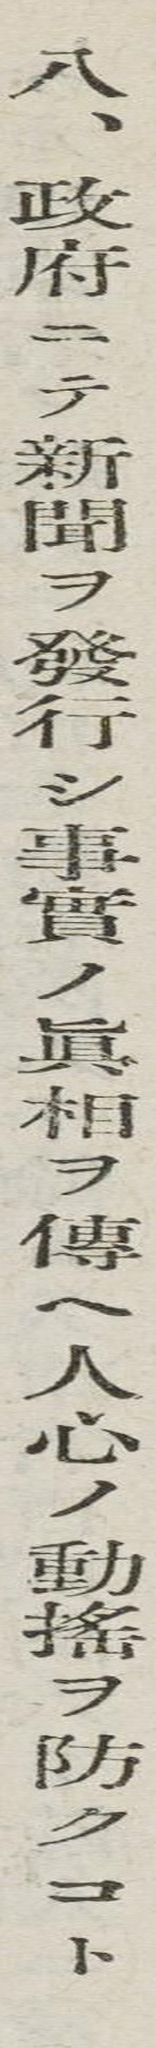八、政府ニテ新聞ヲ発行シ事実ノ真相ヲ伝ヘ人心ノ動揺ヲ防クコト
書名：震災被害状況並救護施設概要
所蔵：東京大学地震研究所図書室 Earthquake Research Institute Library, The University of Tokyo, JAPAN
